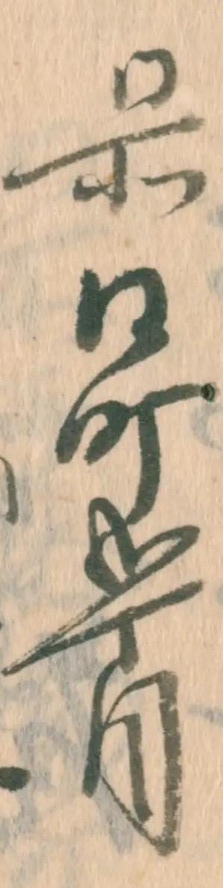同所同町弐丁目
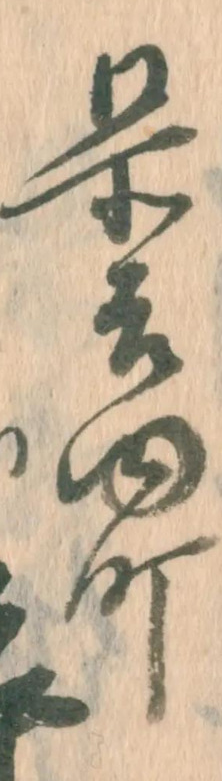同所吉田町
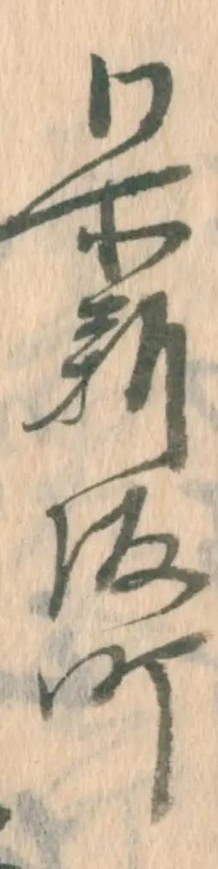同所新坂町

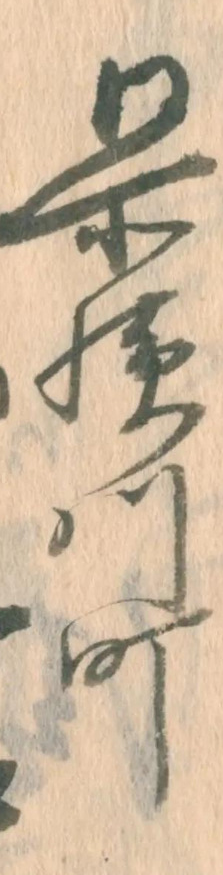同所横川町
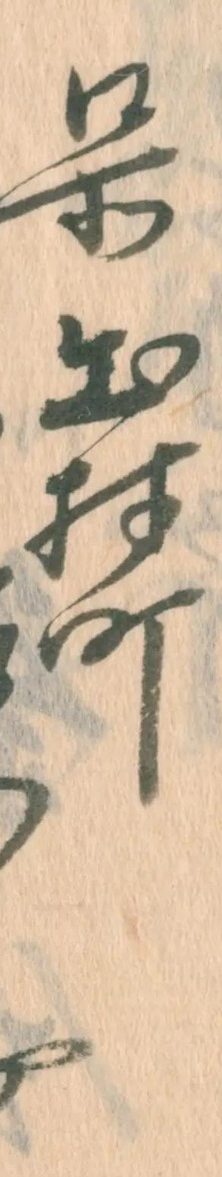同所出村町
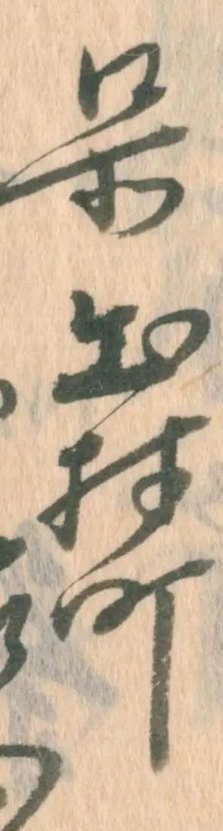同所出村町
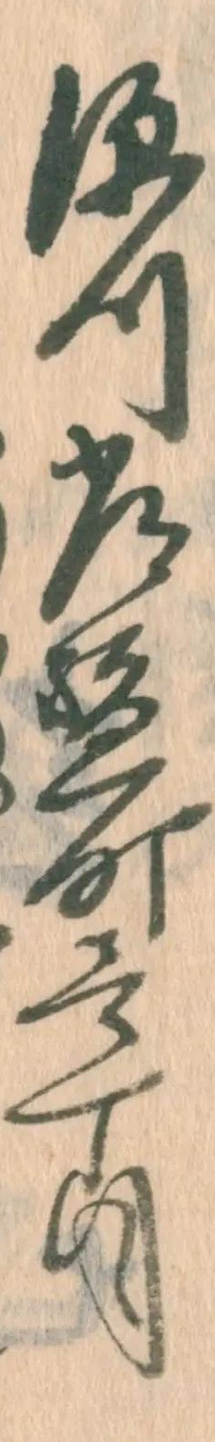同所常盤町壱丁目
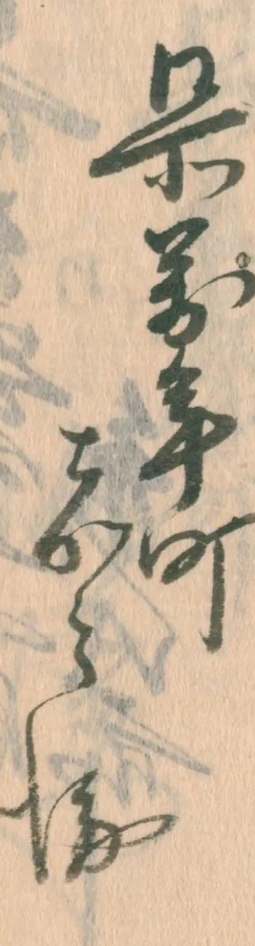同所万年町
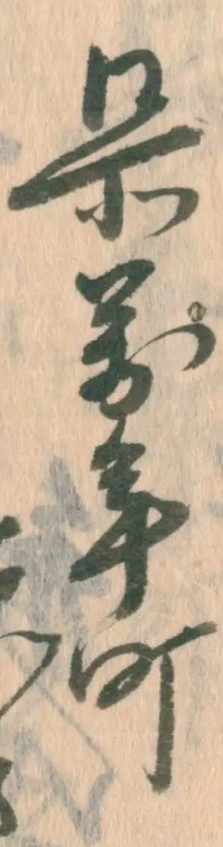同所万年町
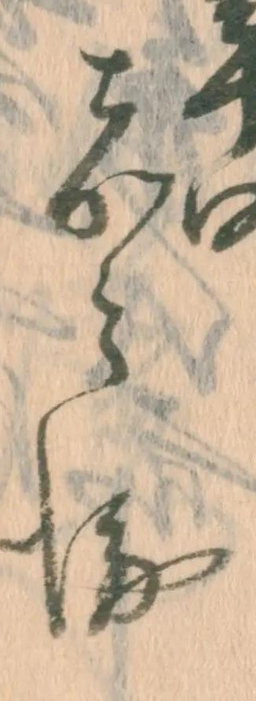嘉兵衛
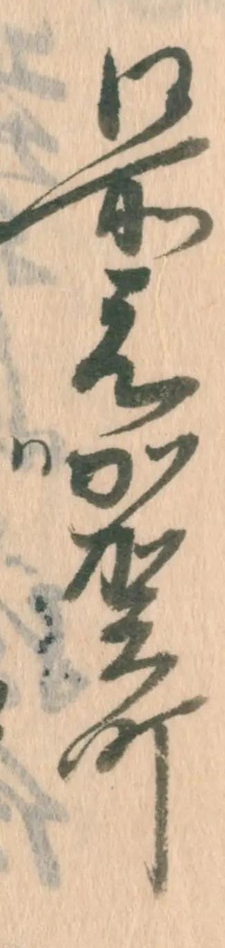同所元加賀町
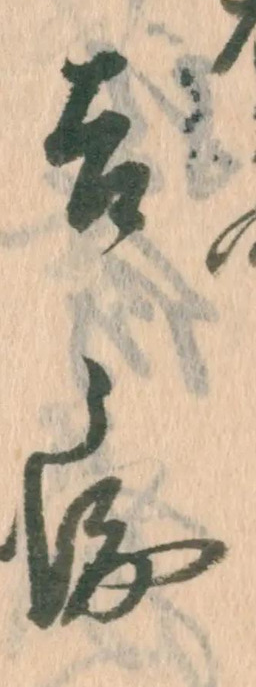吉兵衛
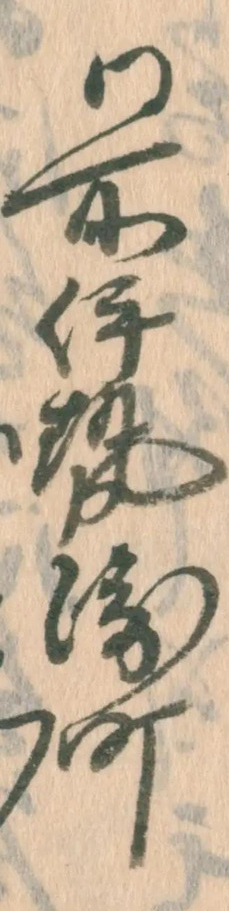同所伊勢崎町
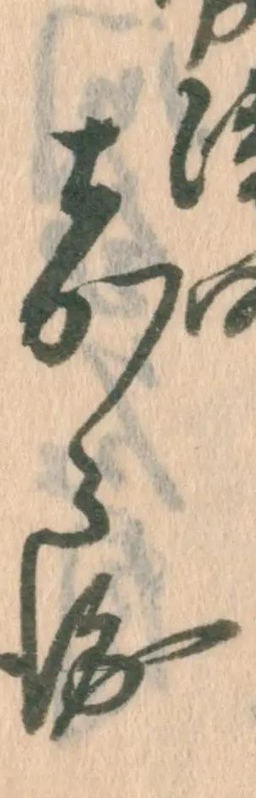嘉兵衛
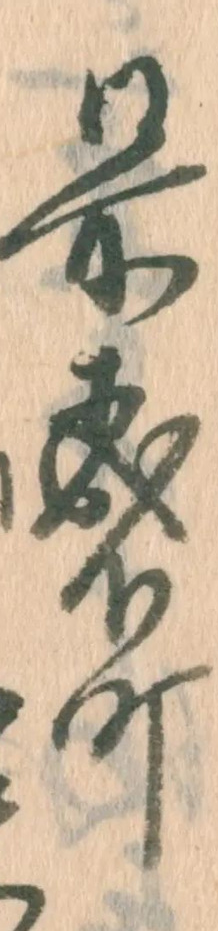同所森下町
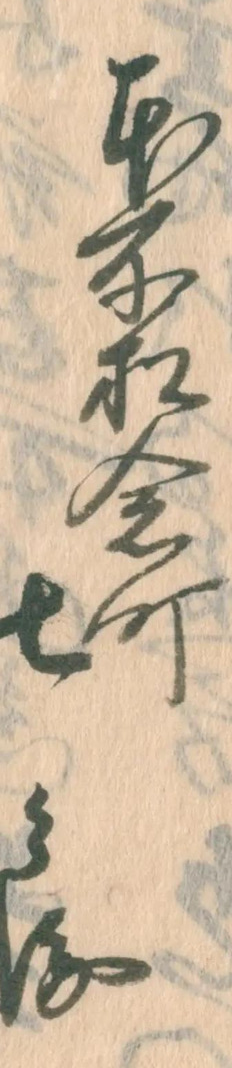本所松倉町
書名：地震災書留 2巻. [1] 内表紙に「地震災書留　安政二卯年　但本所深川御用屋敷地代免除調」とあり
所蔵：国立国会図書館 National Diet Library, JAPAN
